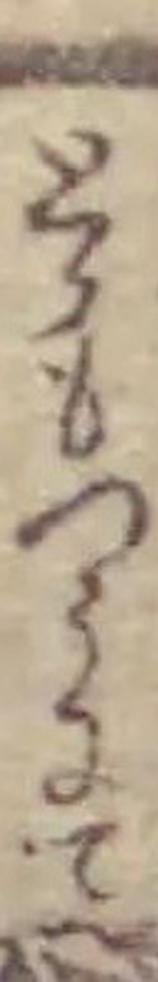とらもつうにて
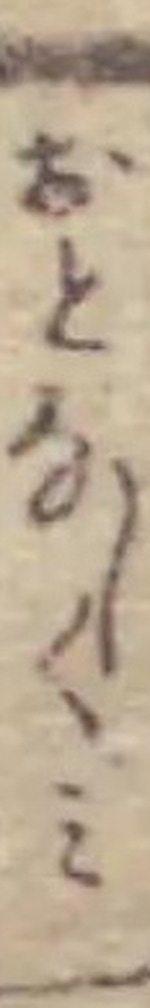おとなしくみ
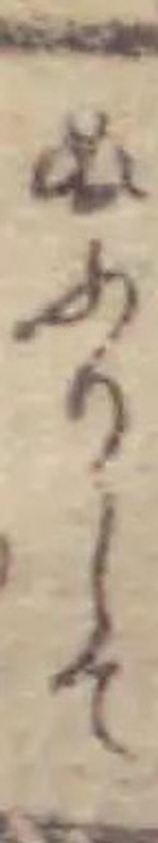ぬふりして
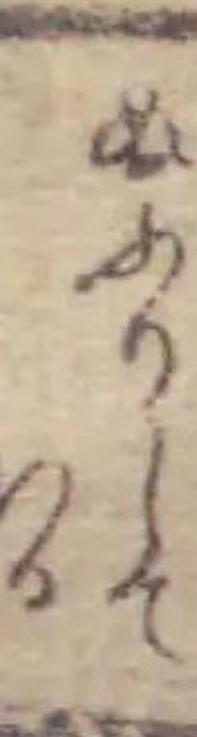ぬふりして

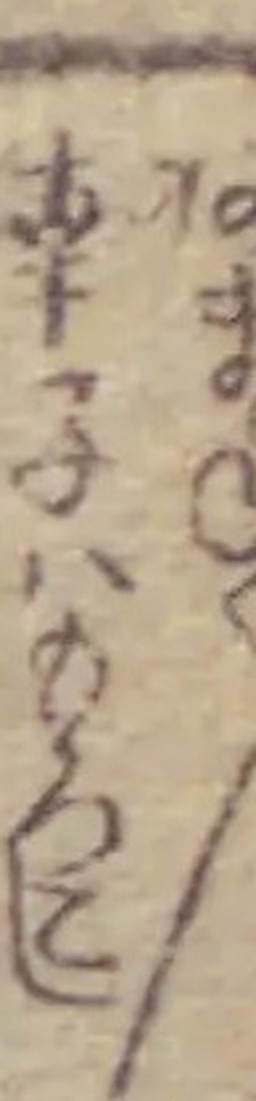幸子はもろこし
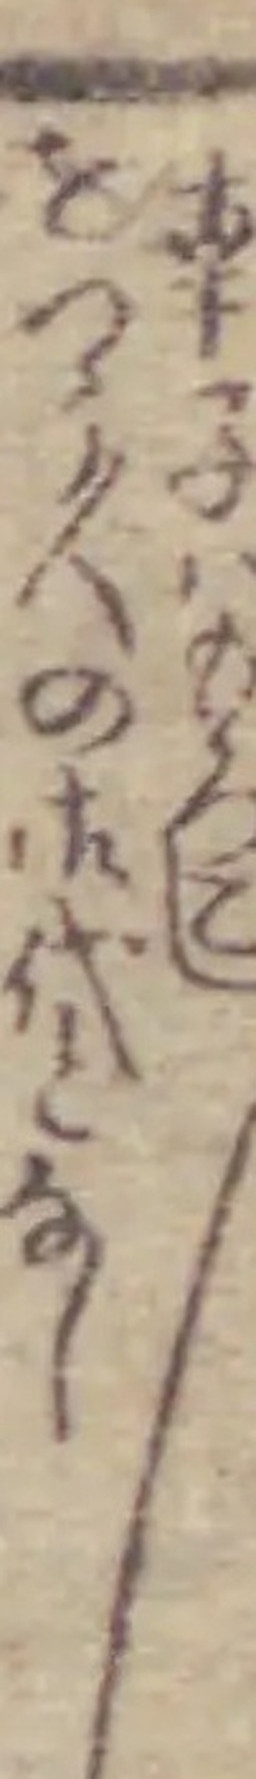をつう人の御代となし
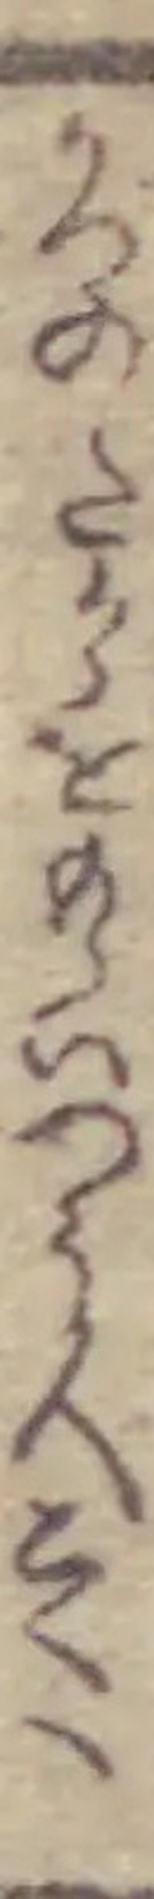かづのたからをもらいつう人こくへ
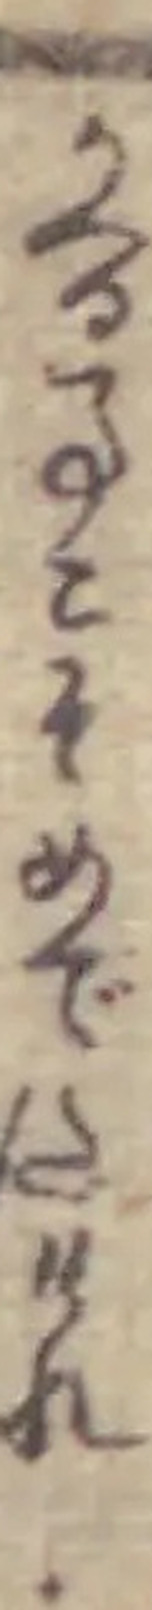かへる事こそめでたけれ
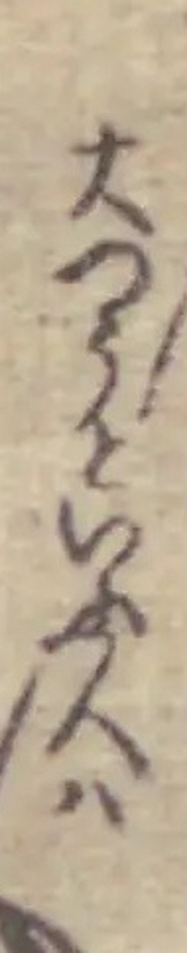大つうといふ人は
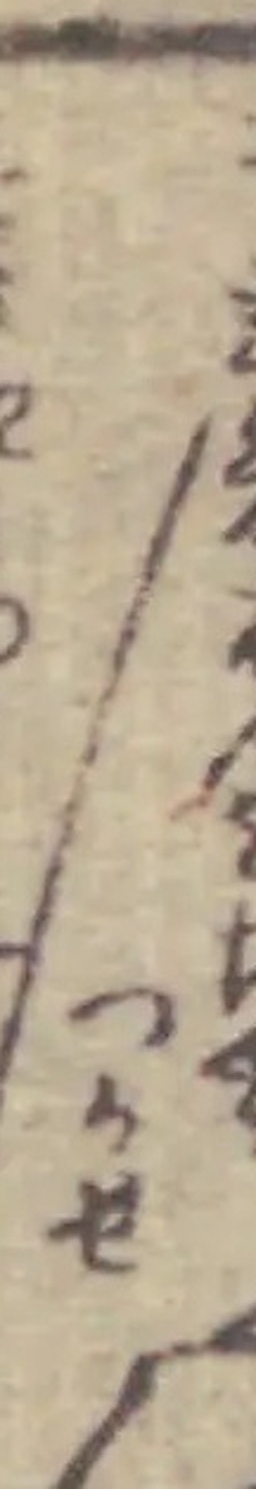つかせ
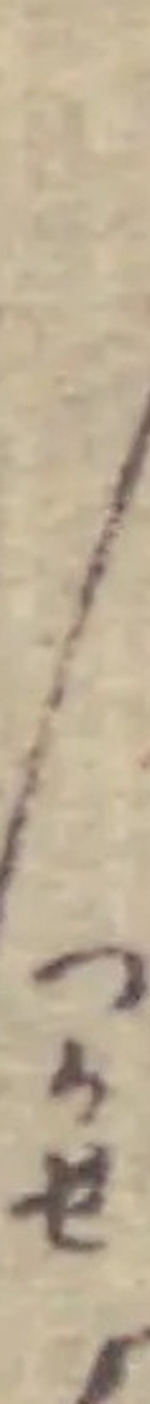つかせ
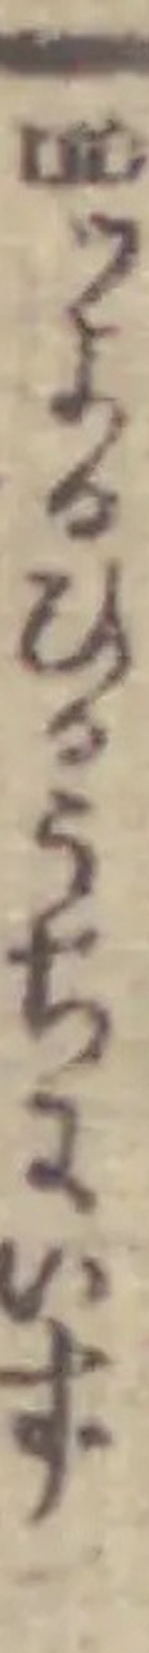四ツよるひるうちにいず
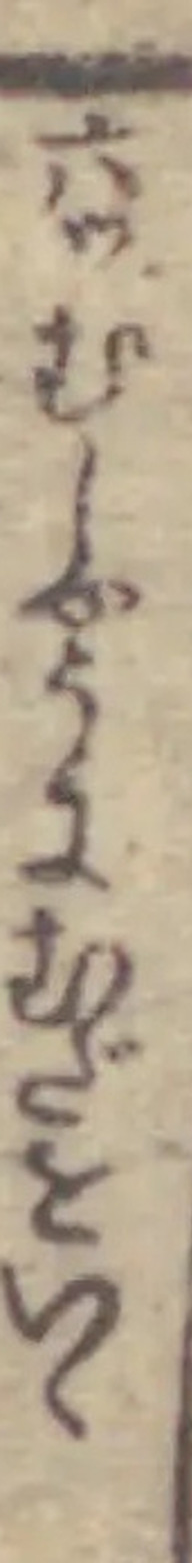六ツむしやうにむだをいゝ
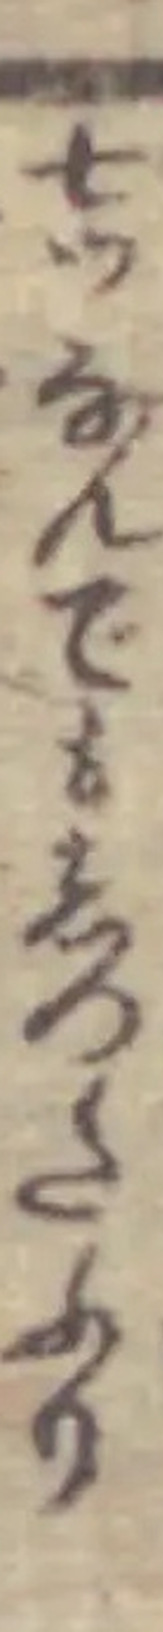七ツなんでもしつたふり
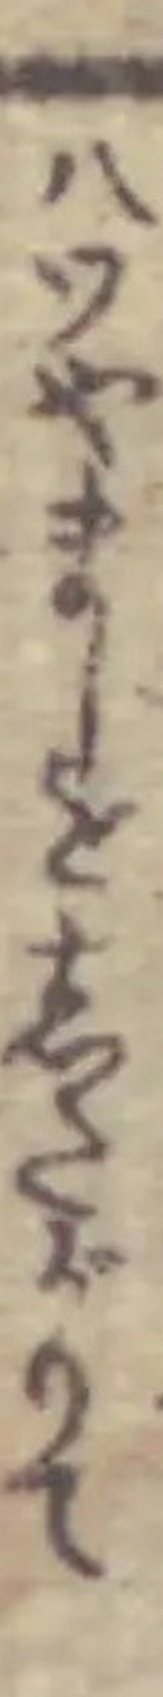八ツやましをしたがりて
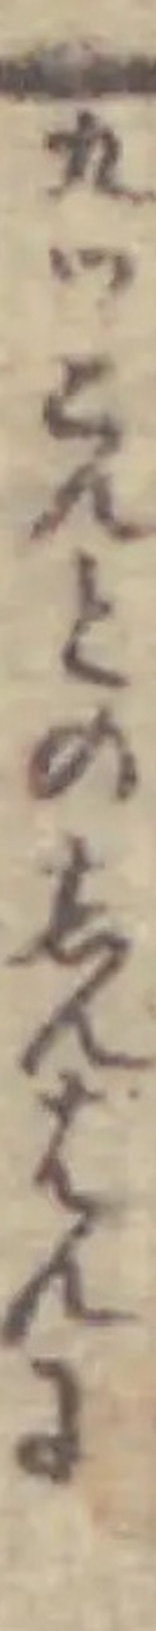九ツこんとのしんはんに
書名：茶羅毛通人 3巻
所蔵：国立国会図書館 National Diet Library, JAPAN
